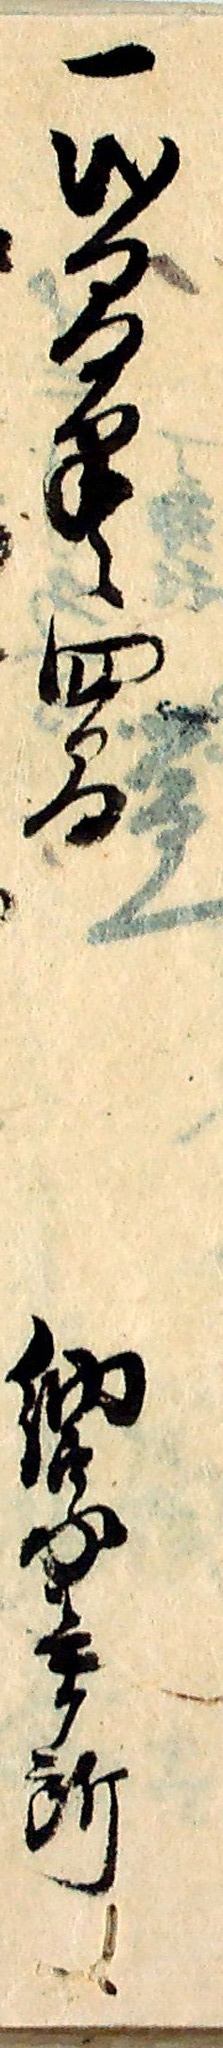一弐間半に四間納家壱ケ所
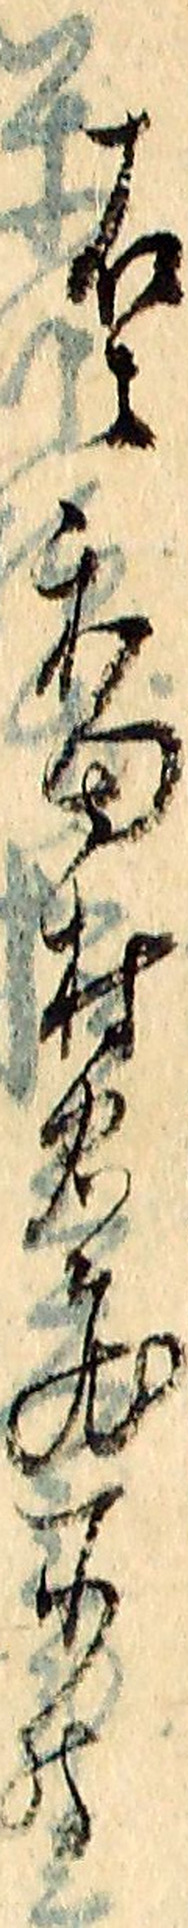右は和田村忠蔵所持
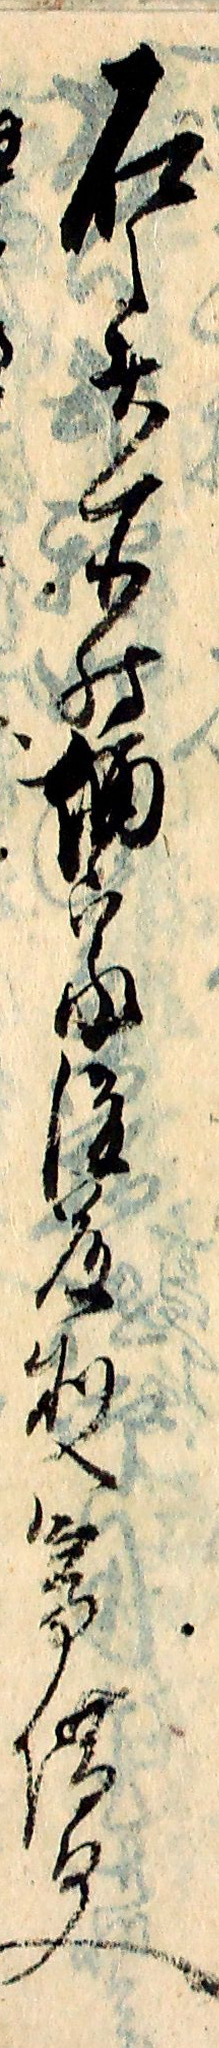右之者所持納家後藤利八郎借受
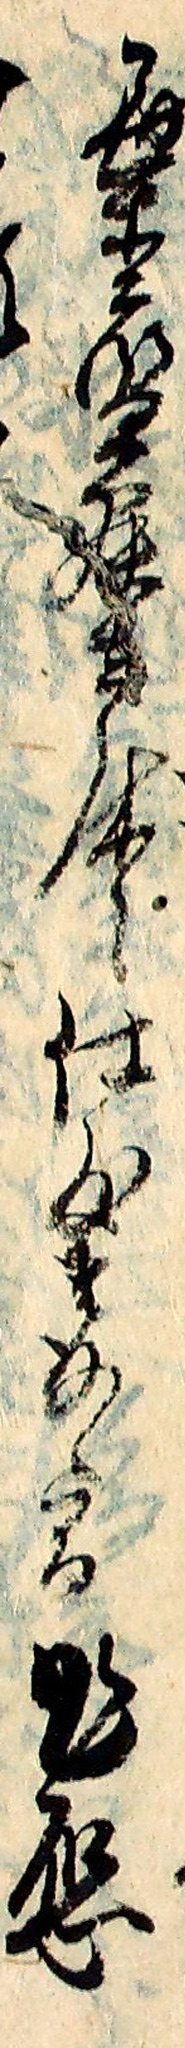葉藍寐せ床に仕度奉存候間乍恐

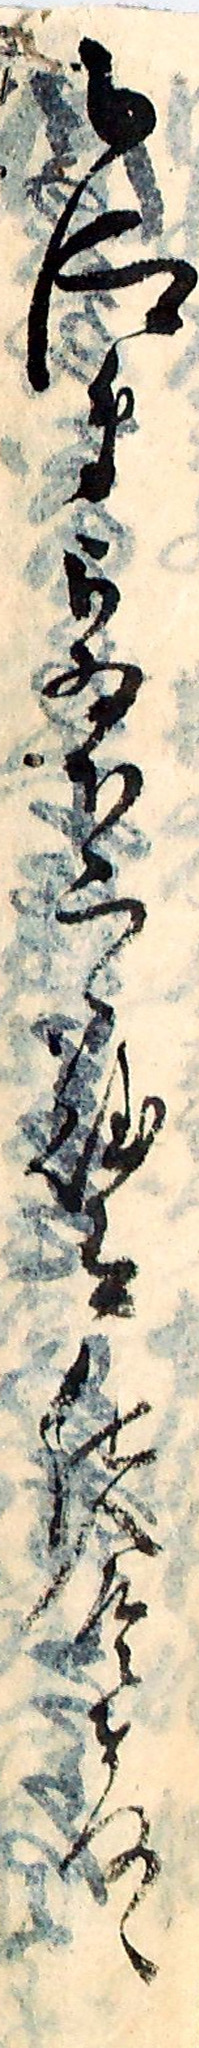被仰付被為下候はゝ難有仕合に奉存候
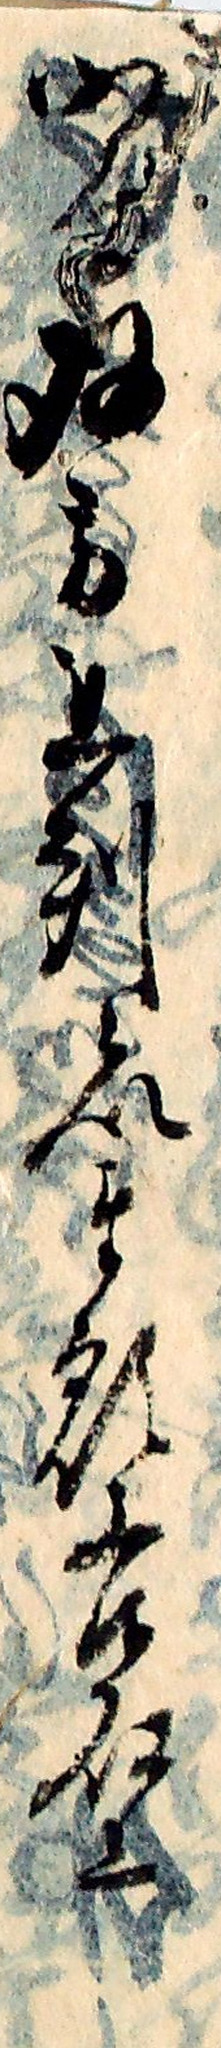仍て双方連判を以奉願上候以上
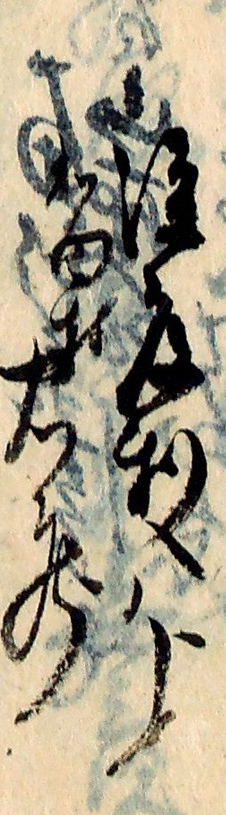後藤利八郎
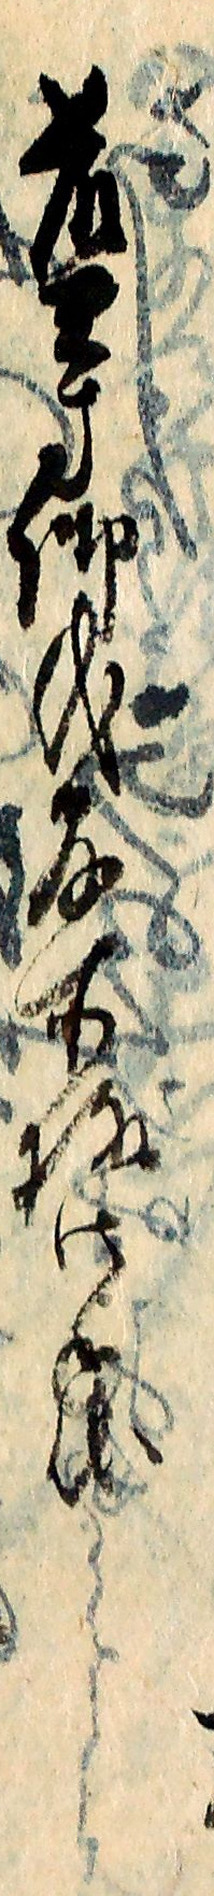藍方御代官所様御手代
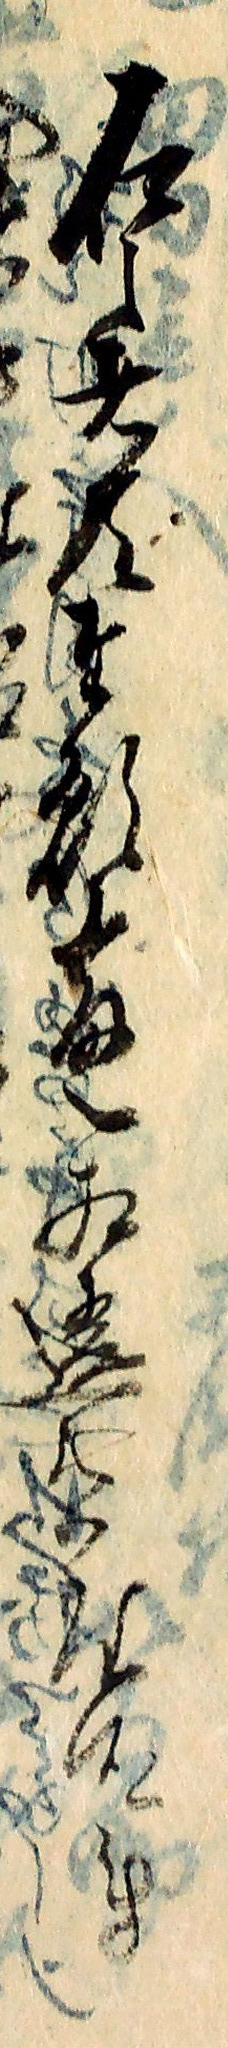右之者共奉願上通無御座候に付
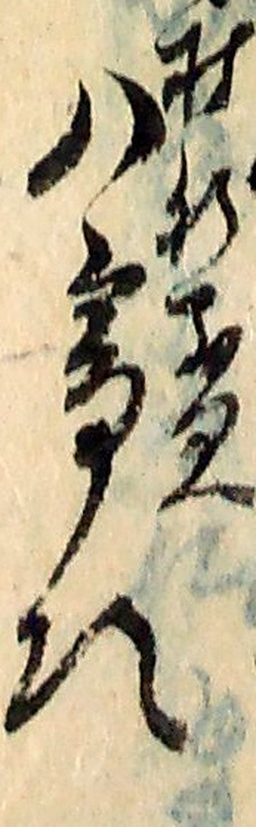八郎次
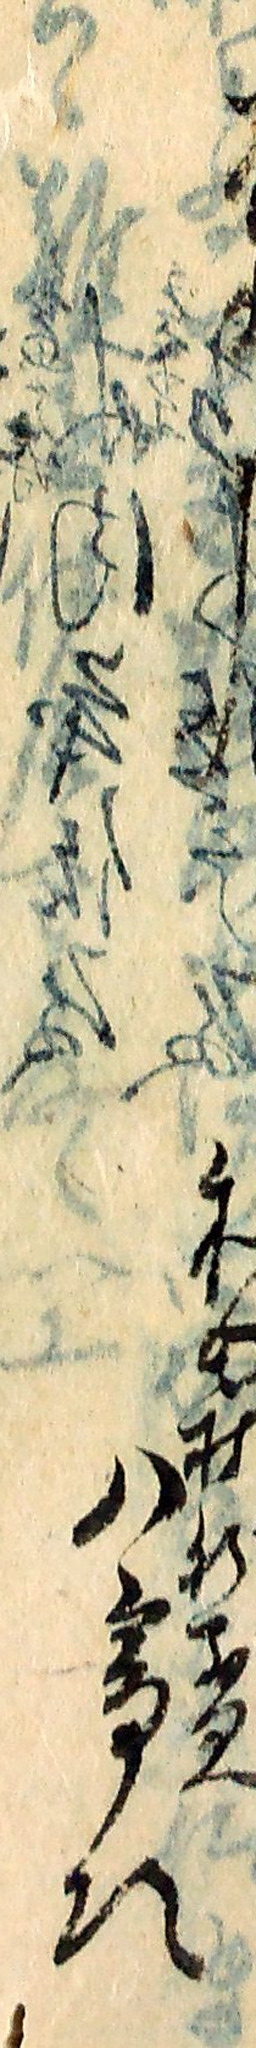八郎次
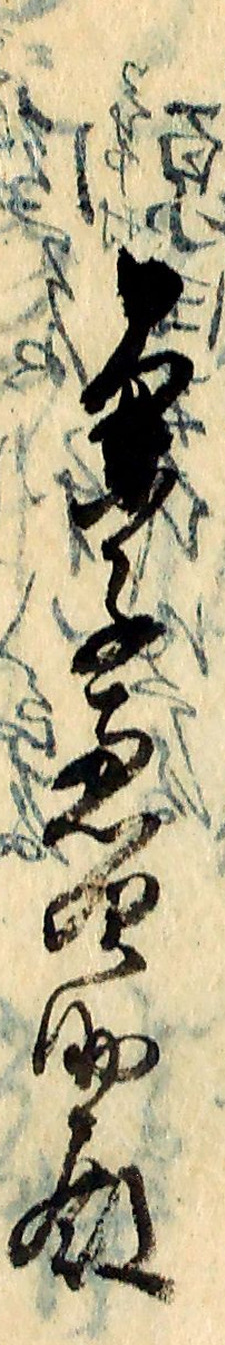兼子恵次助殿
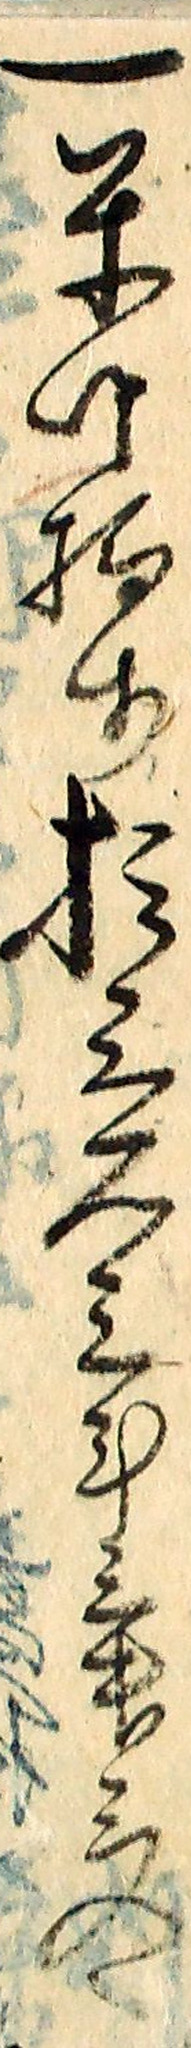一米御指紙拾三石三斗三升三合
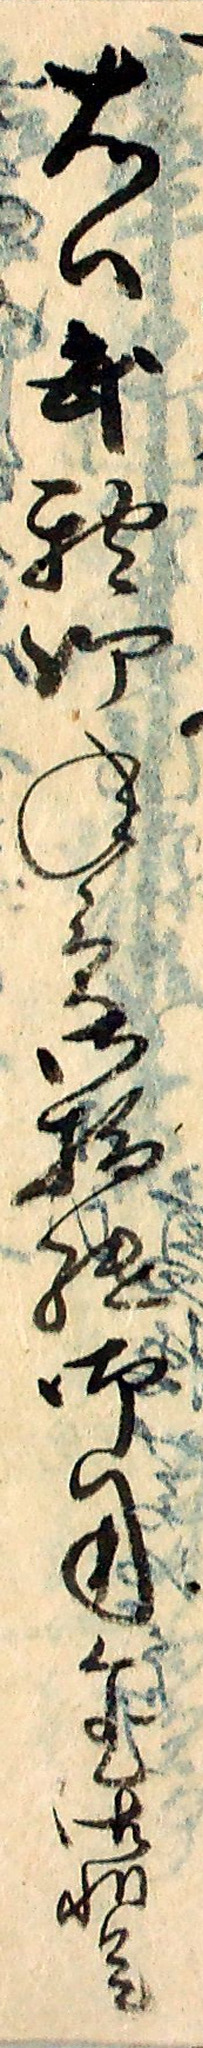右は当秋御年貢御指継御用金御利足
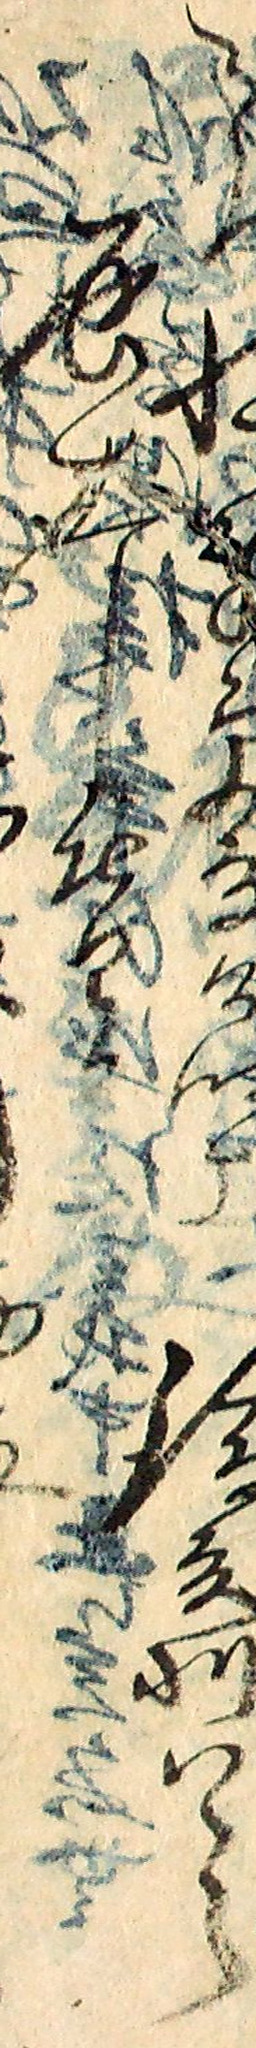辰十一月廿五日

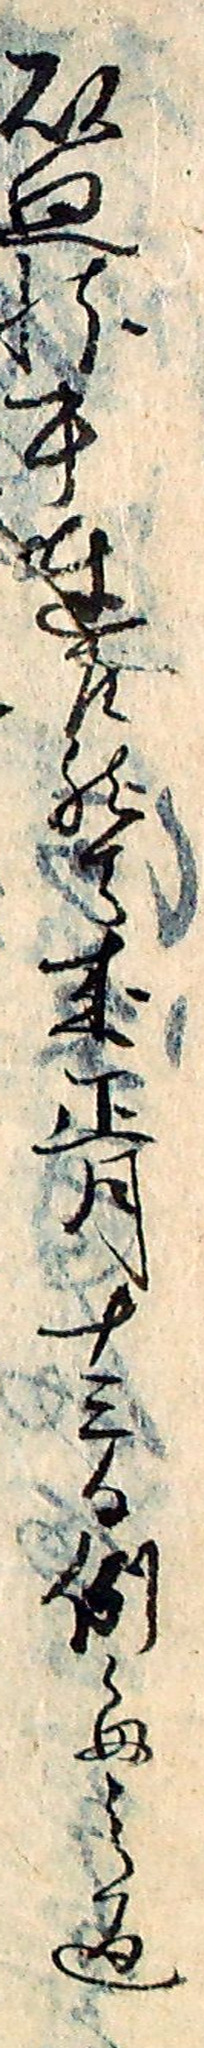以廻状申達候然は来正月十三日例毎之通
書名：諸御願書控(後藤氏壱番）
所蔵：鳴門教育大学 Naruto University of Education
